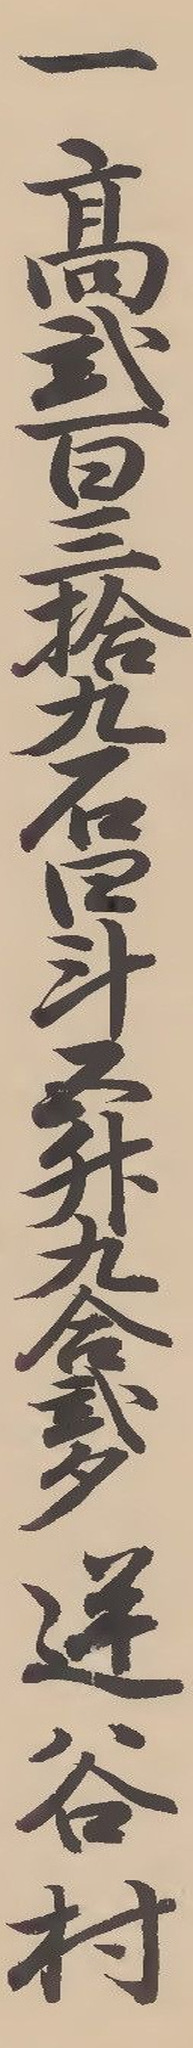一高弐百三拾九石四斗五升九合弐勺逆谷村
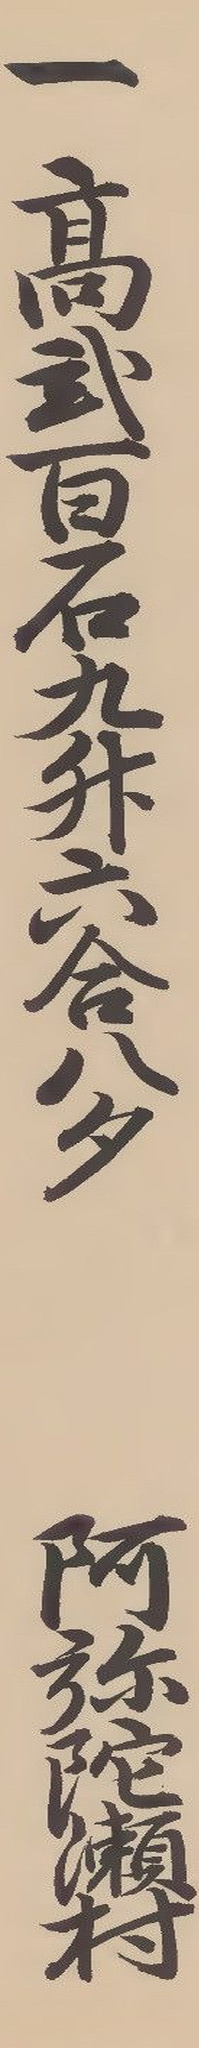一高弐百石九升六合八勺阿弥陀瀬村
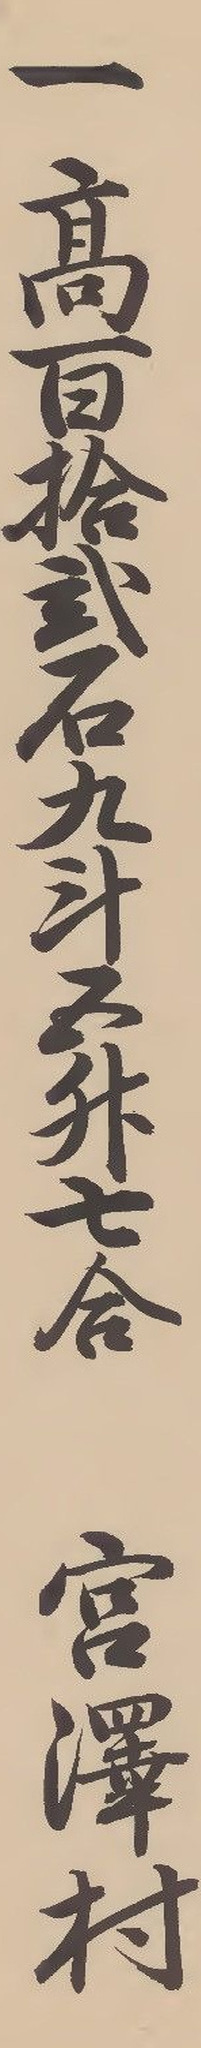一高百拾弐石九斗五升七合宮沢村
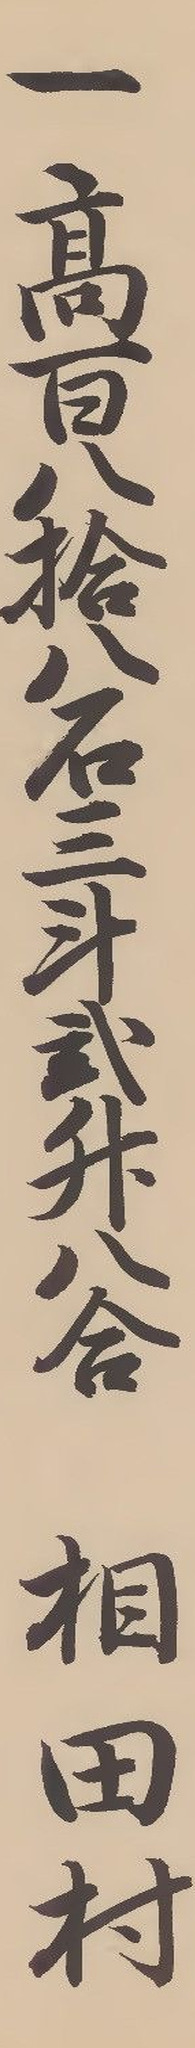一高百八拾八石三斗弐升八合相田村
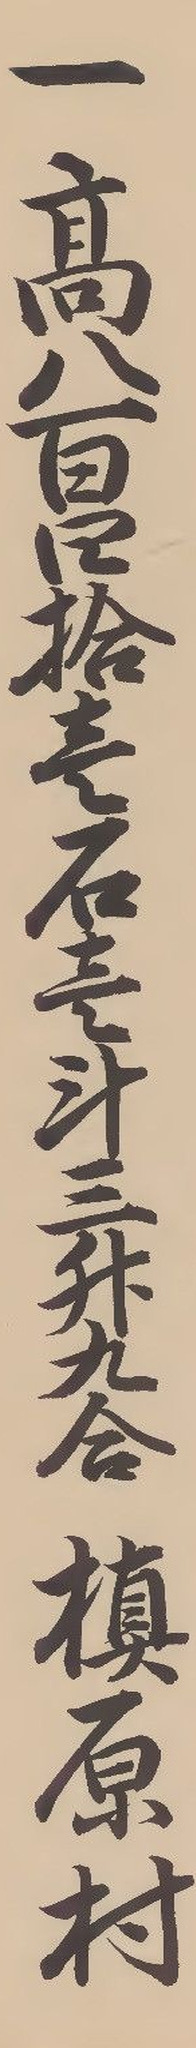一高八百四拾壱石壱斗三升九合槙原村

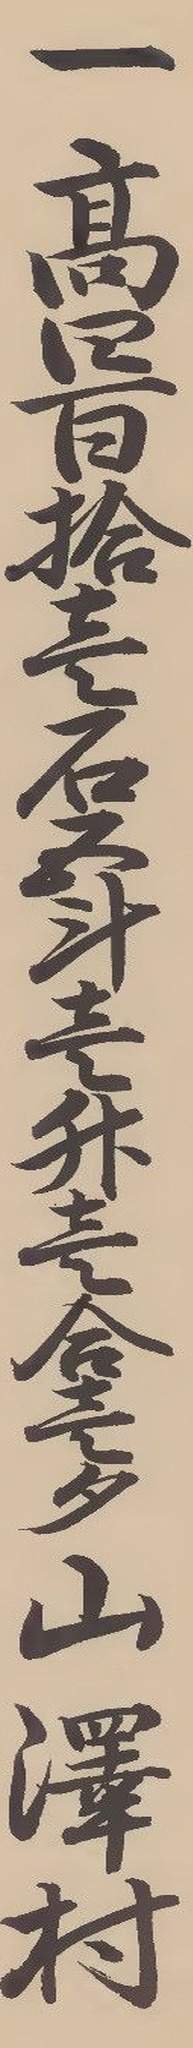一高四百拾壱石五斗壱升壱合壱勺山沢村
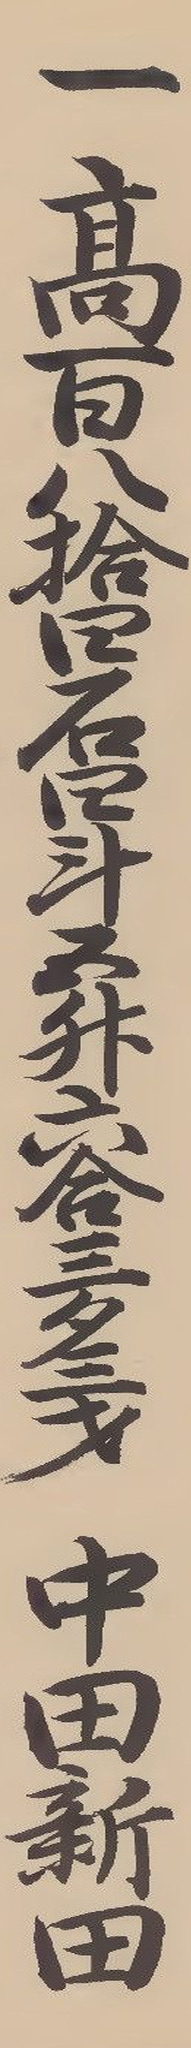一高百八拾四石四斗五升六合三勺三才中田新田
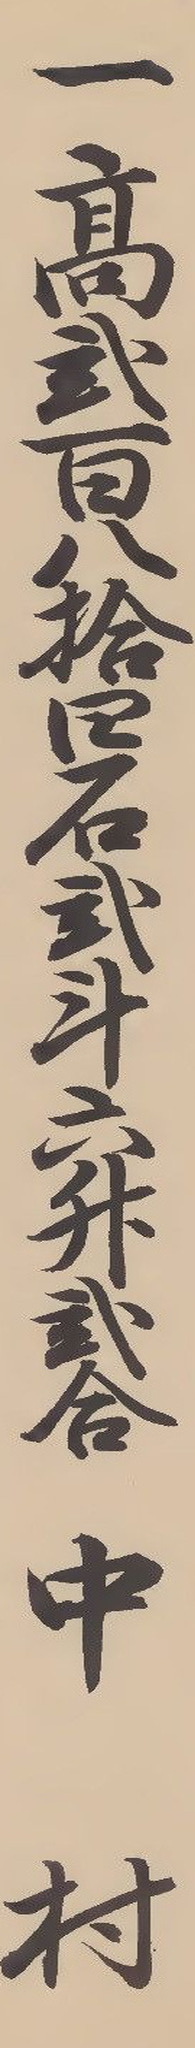一高弐百八拾四石弐斗六升弐合中村
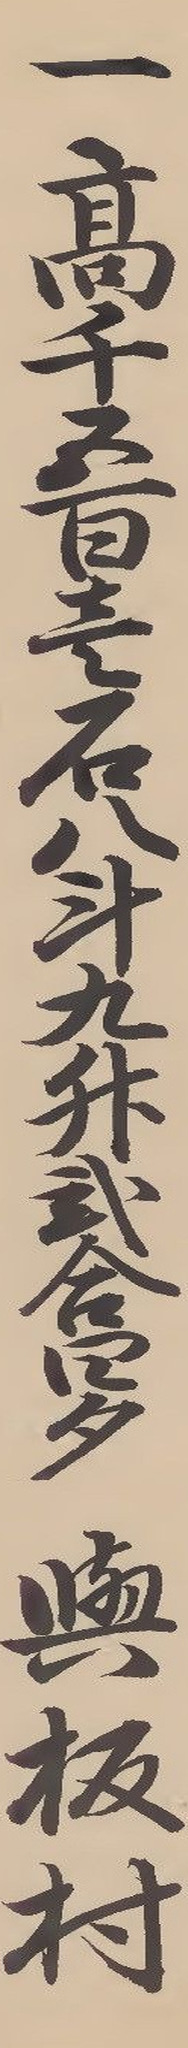一高千五百壱石八斗九升弐合四勺与板村
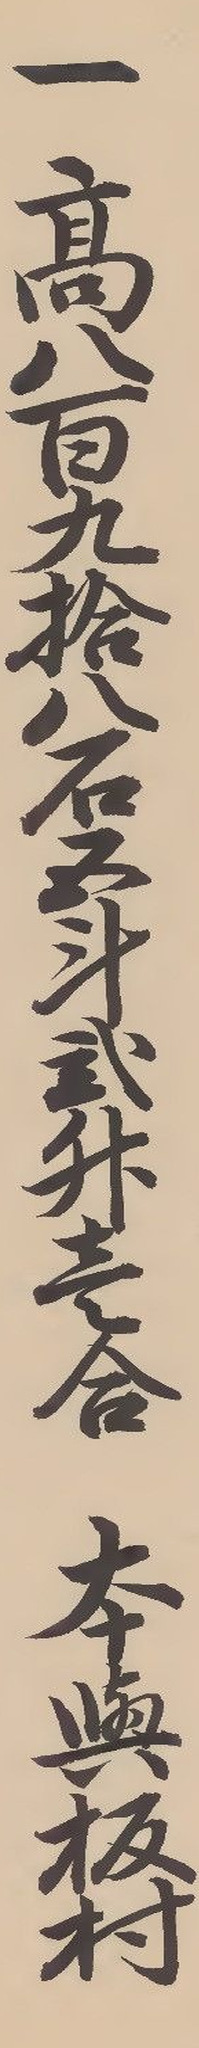一高八百九拾八石五斗弐升壱合本与板村
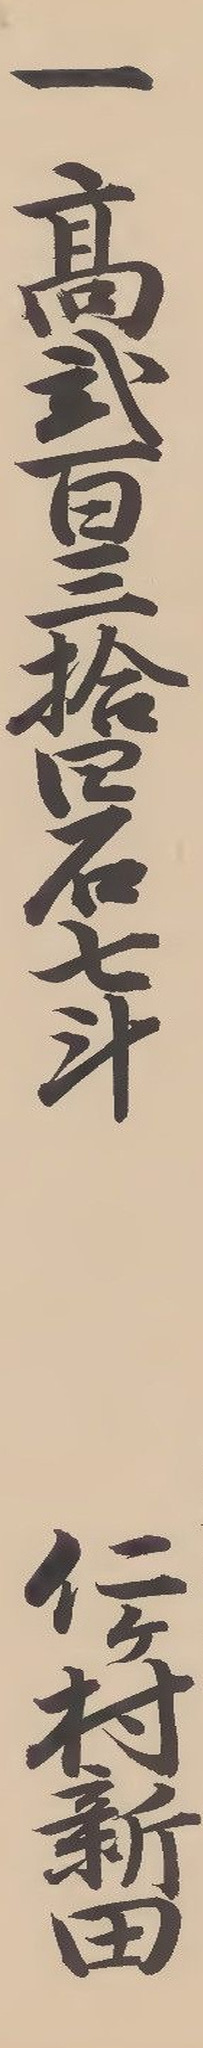一高弐百三拾四石七斗仁ヶ村新田
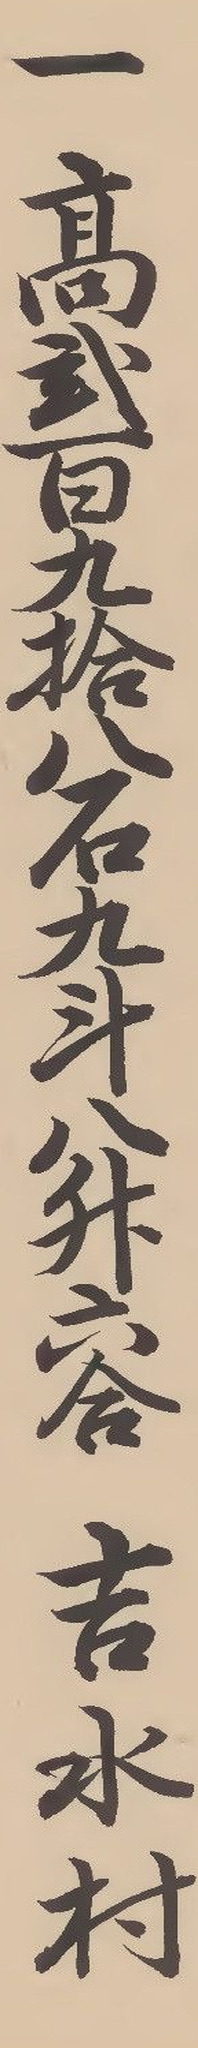一高弐百九拾八石九斗八升六合吉水村
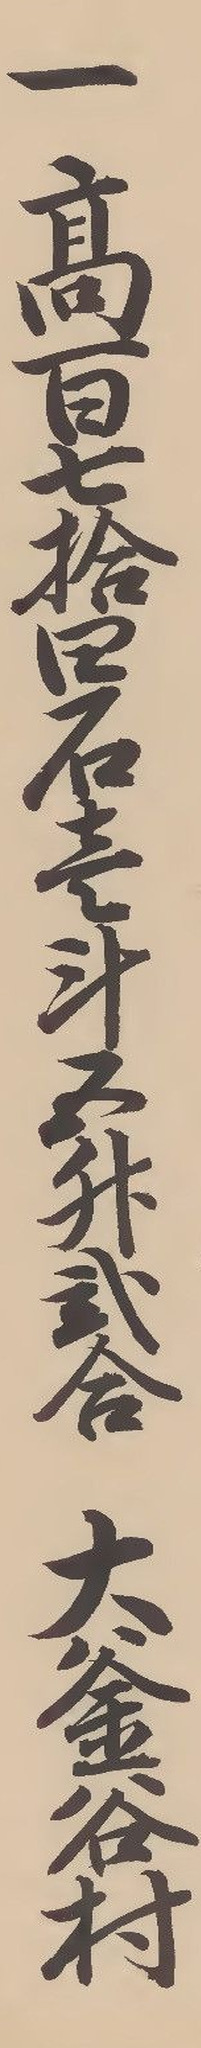一高百七拾四石壱斗五升弐合大釜谷村

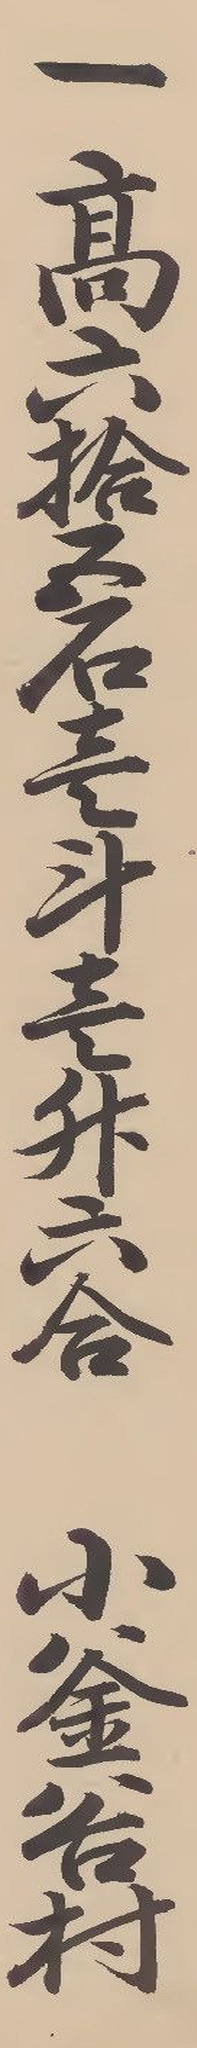一高六拾五石壱斗壱升六合小釜谷村
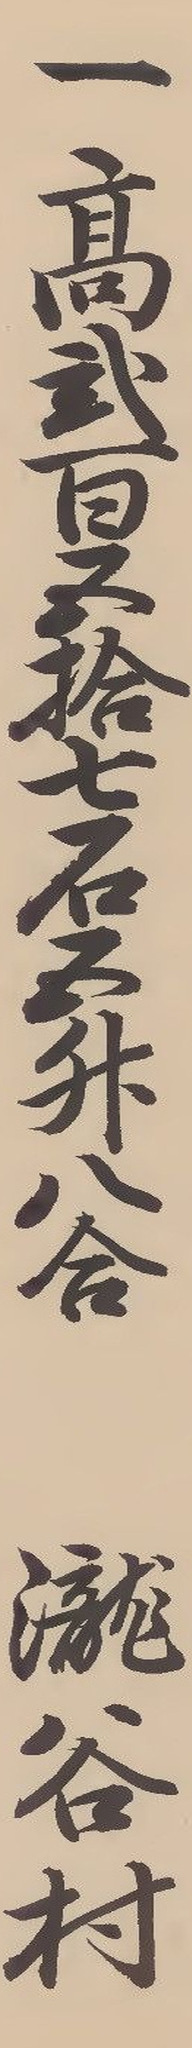一高弐百五拾七石五升八合滝谷村
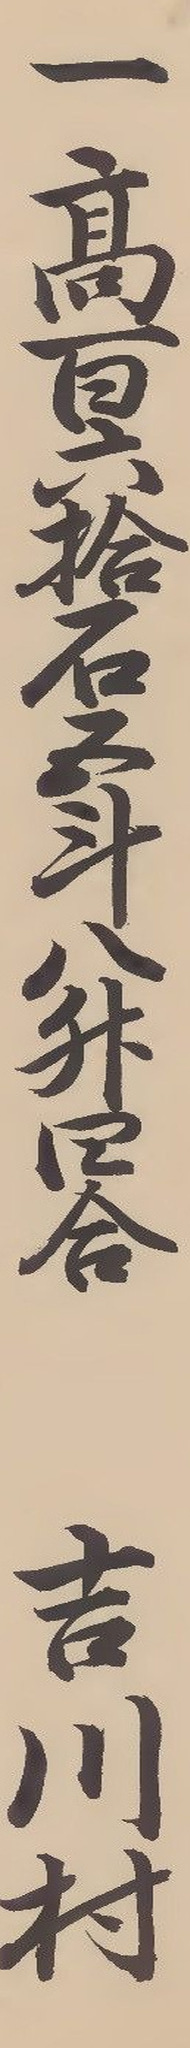一高百六拾石五斗八升四合吉川村
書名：越後国郷帳　中
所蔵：国立公文書館 National Archives of Japan
